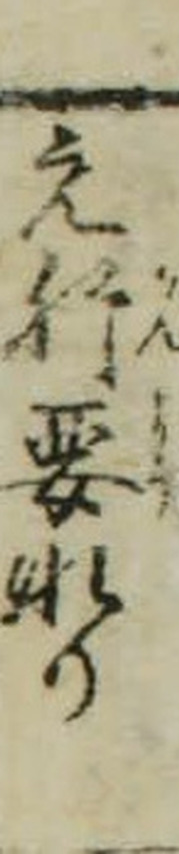え肝要なり
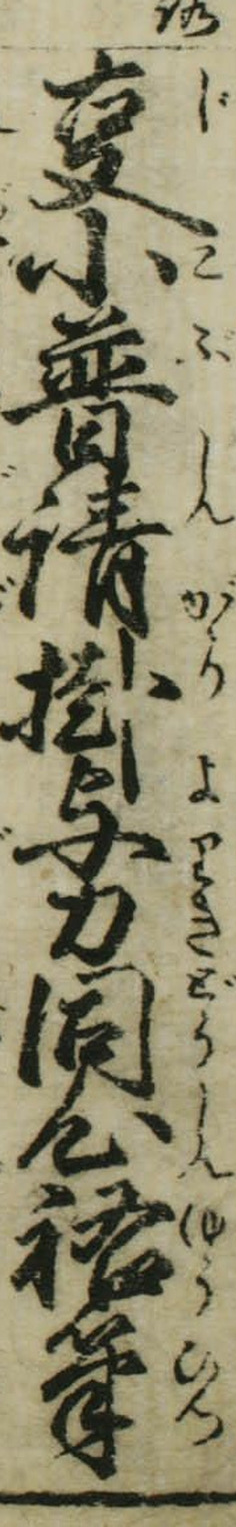吏小普請掛与力同心祐筆
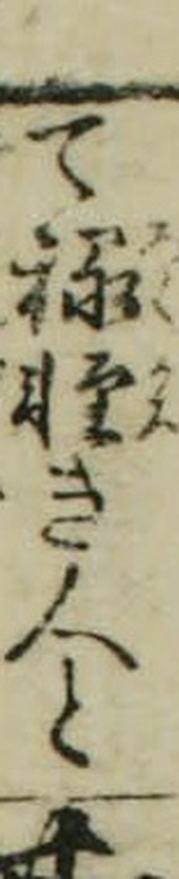て禄軽き人と
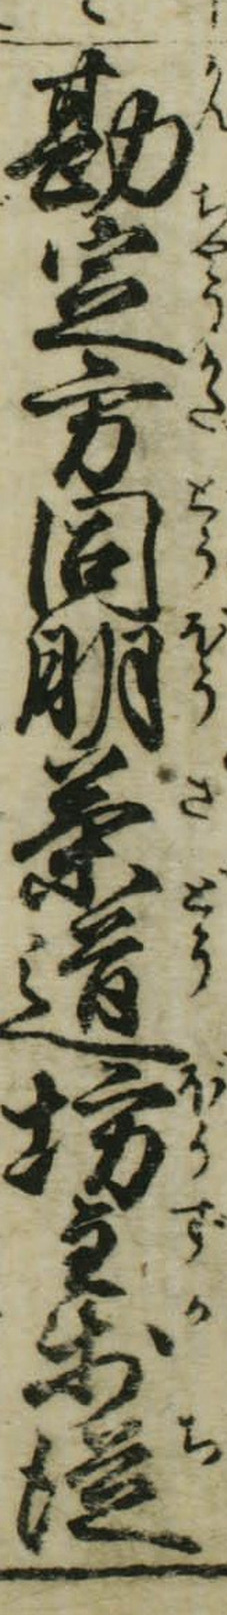勘定方同朋茶道坊主歩徒
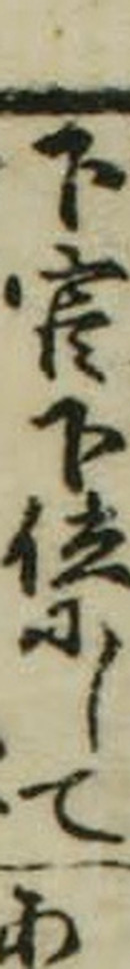下官下位にして
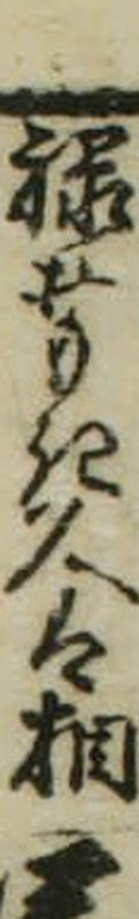禄おもき人は相
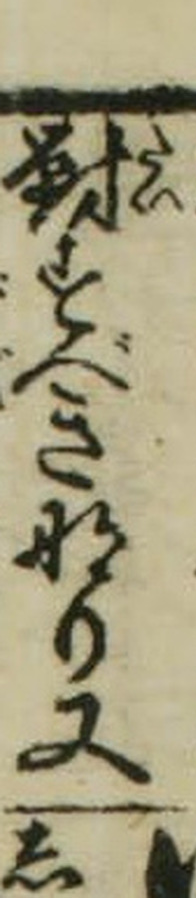対すべきなり又
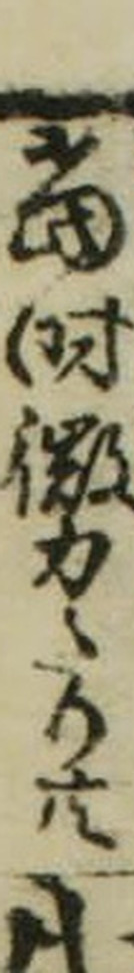当時微力たりは
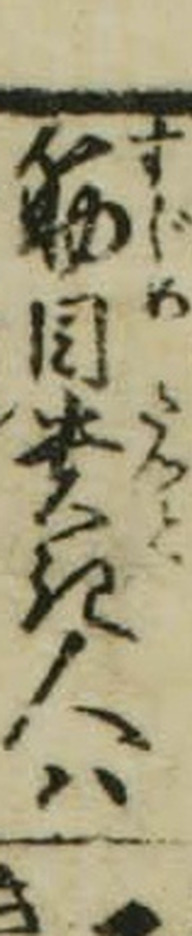筋目貴き人は
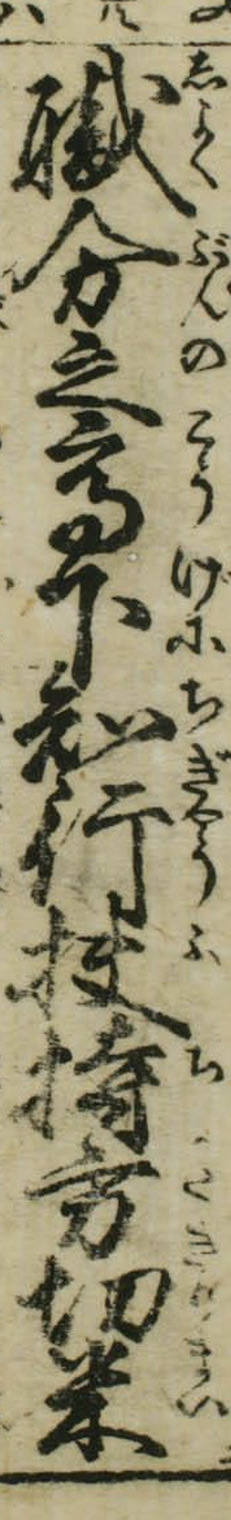職分の高下知行扶持方切米
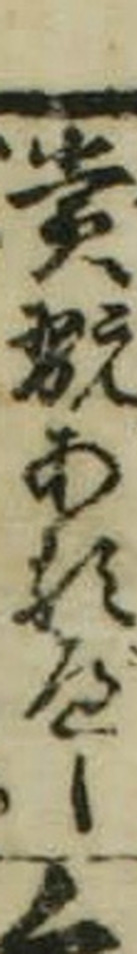賞翫あるべし
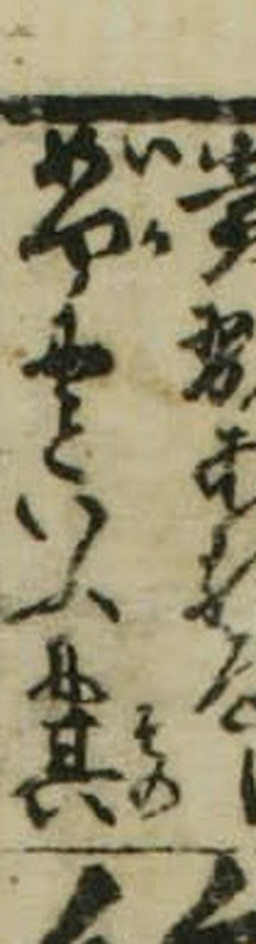如何にといふに其
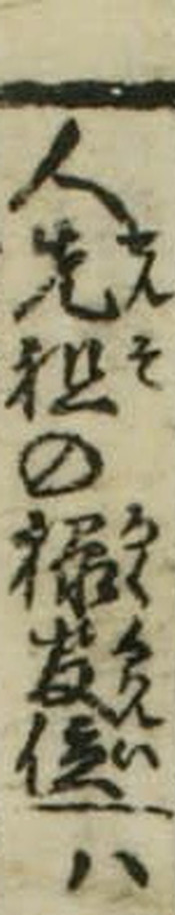人先祖の禄官位
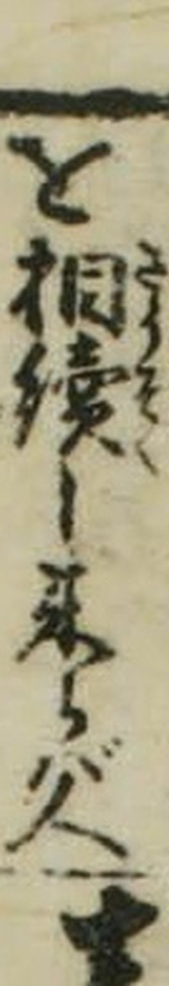を相続し来らば人
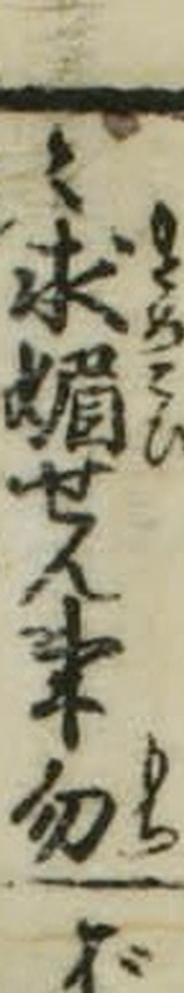と求媚せん事勿
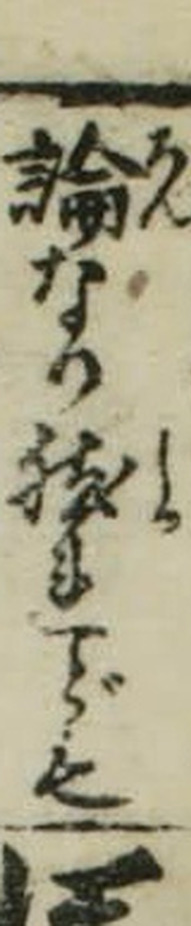論なり然れども
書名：増補職人往来
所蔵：東京学芸大学教育コンテンツアーカイブ
